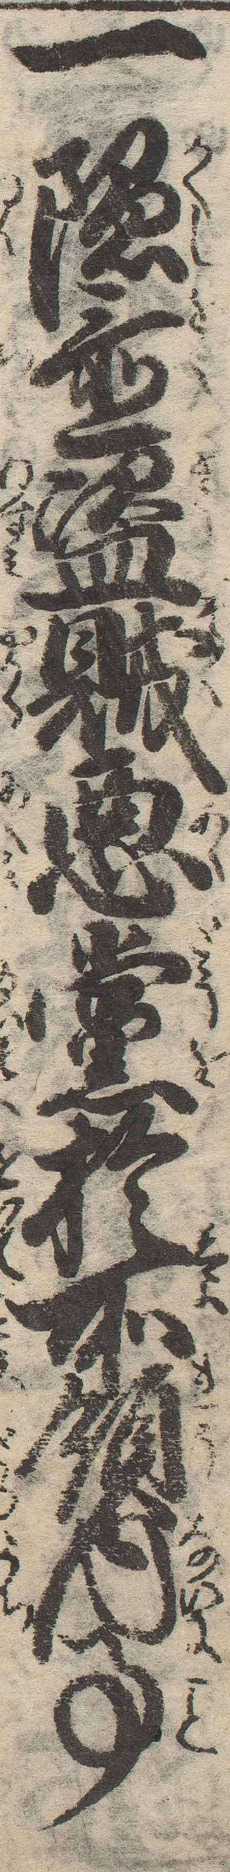一隠置盗賊悪黨於所領内事
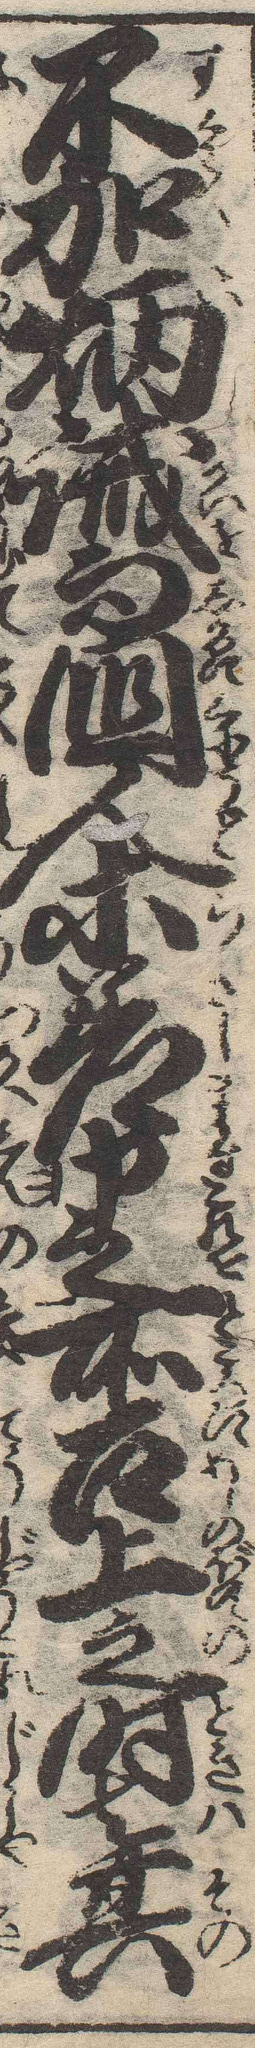不加炳誡而国人等差-申之所召上之時者其
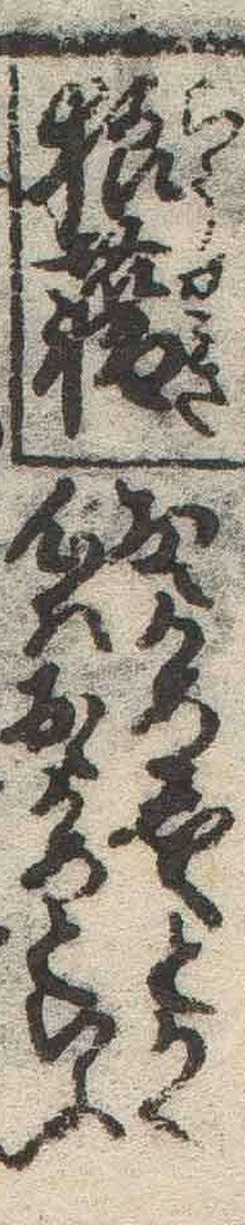心はおゝかめといふ
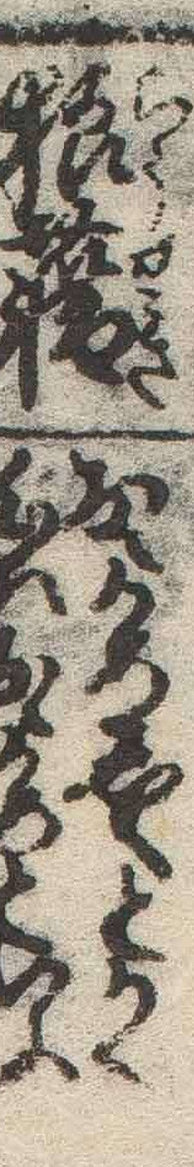狼藉おゝかめしくとかく
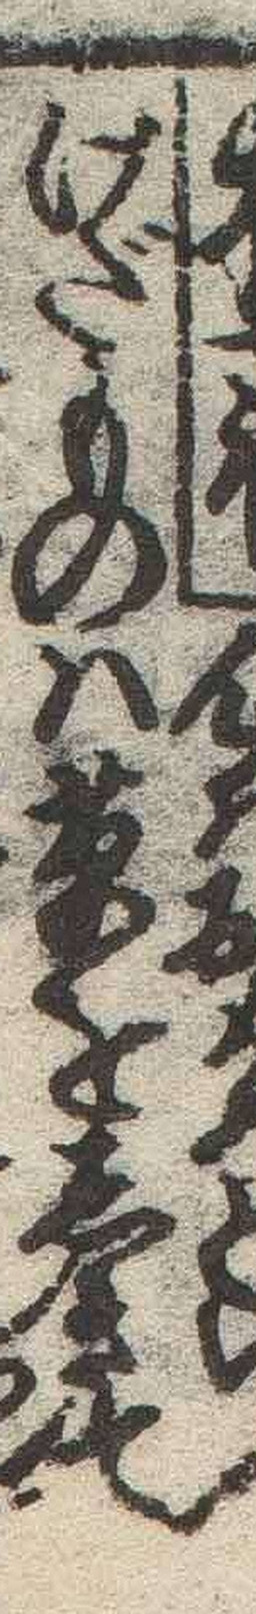けだものは草をしきて
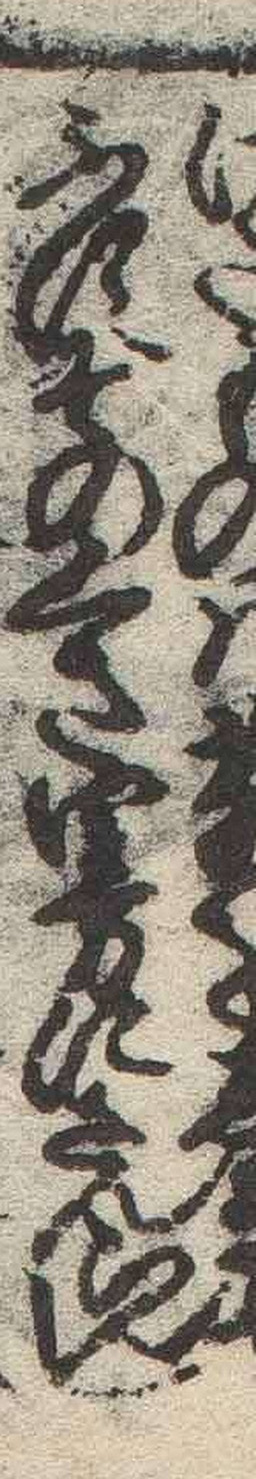ふすそのくさ四方にさんらんし
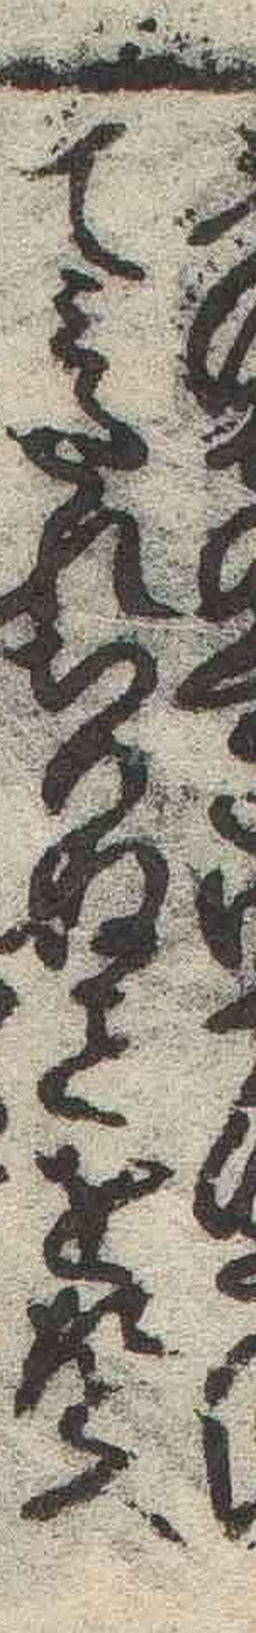てみたれちりぬことをたとへ
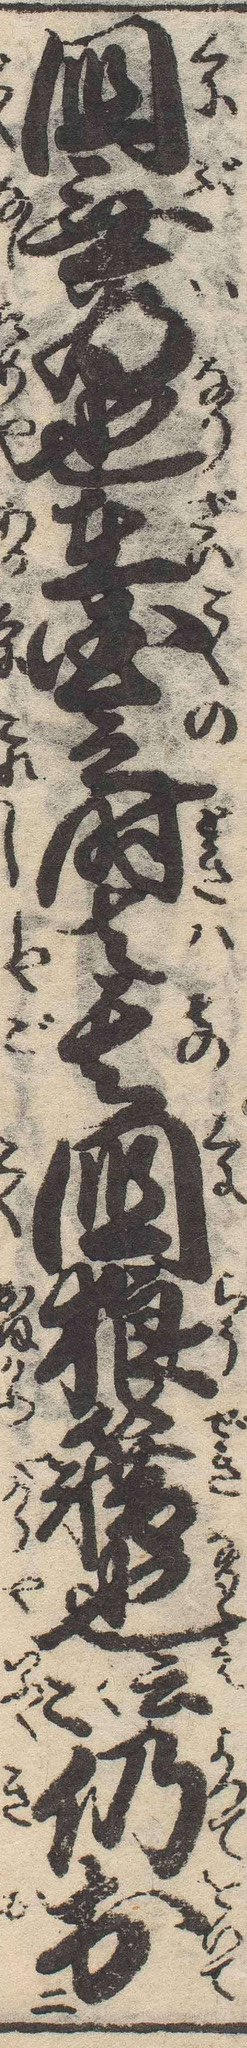国無為也在国之時者其国狼藉也云々仍於
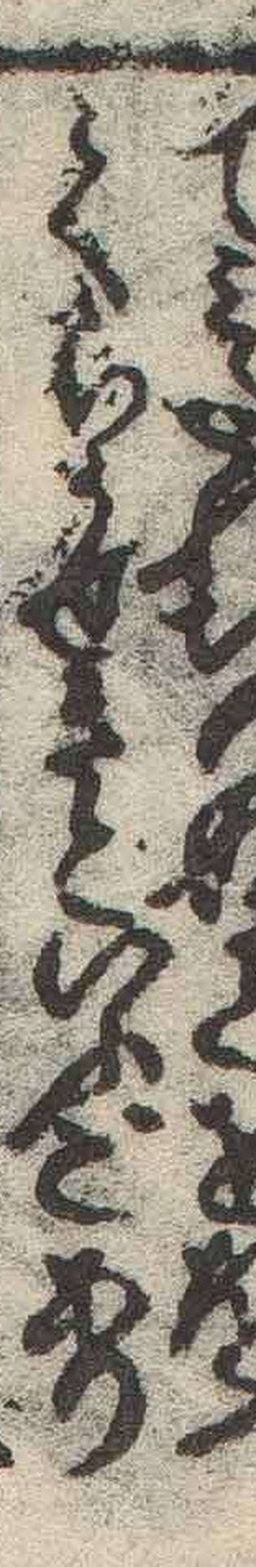てらうせきといふとあり
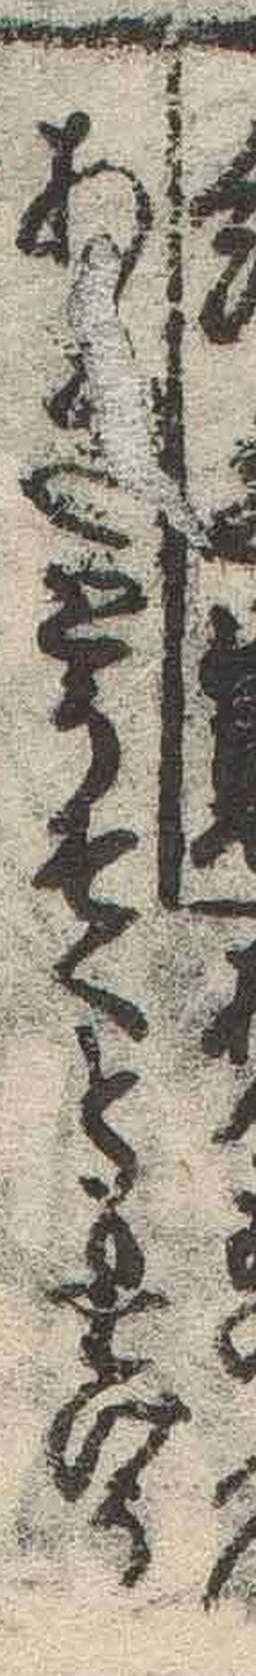あしきとうそくともをけう
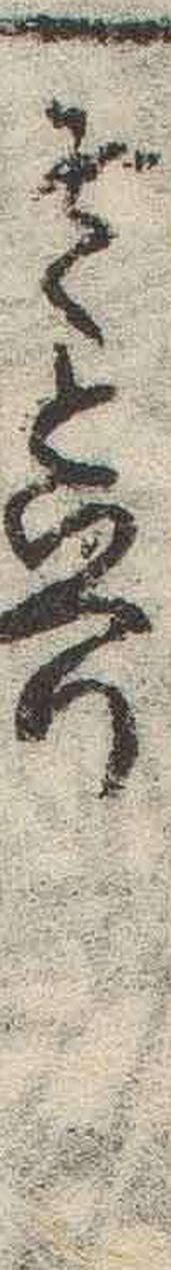ぞくといへり
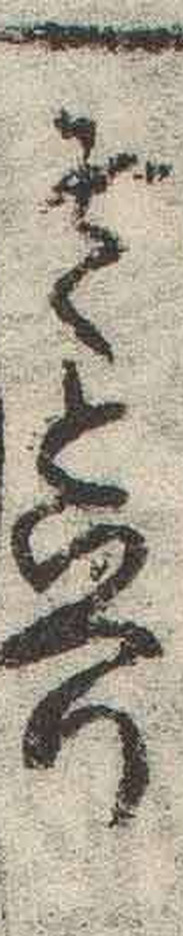ぞくといへり
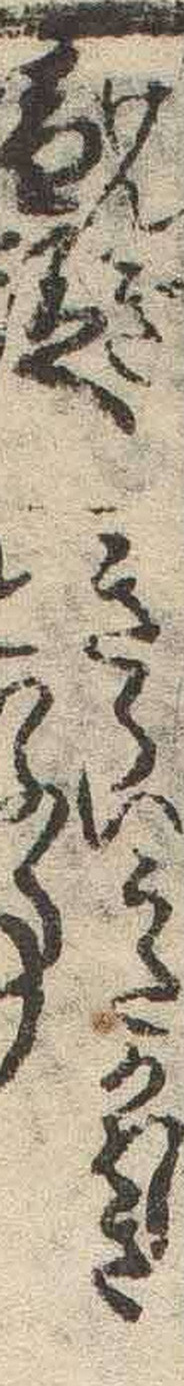嫌疑きらいうたかはしき
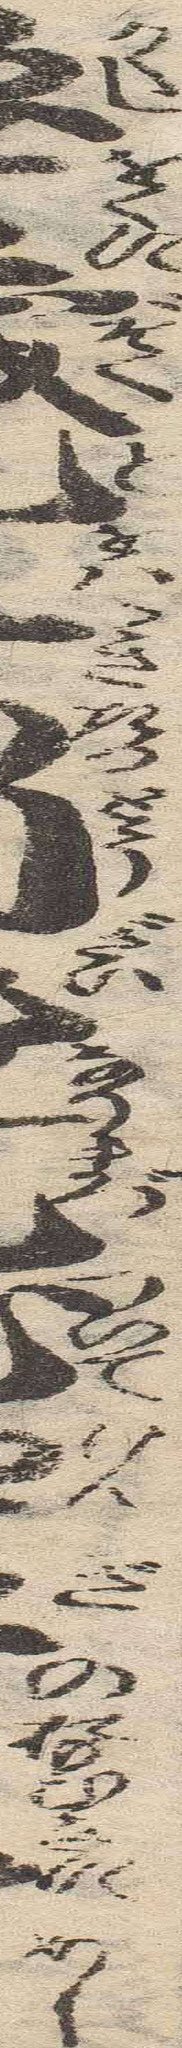かくしをくにぞくとをはへきたるどうざいなりまづついてけんぎのおもむきにめし
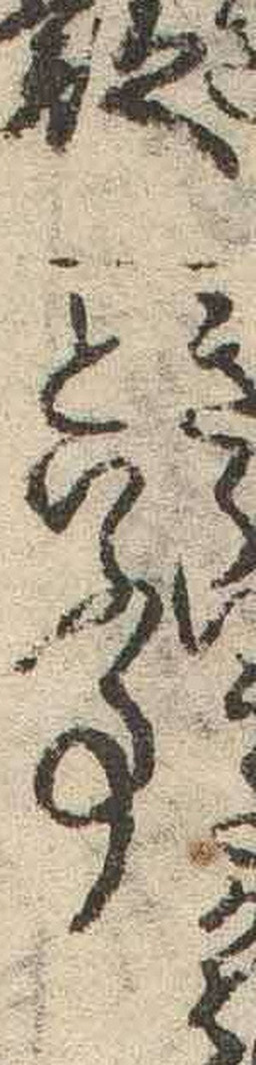といふ事
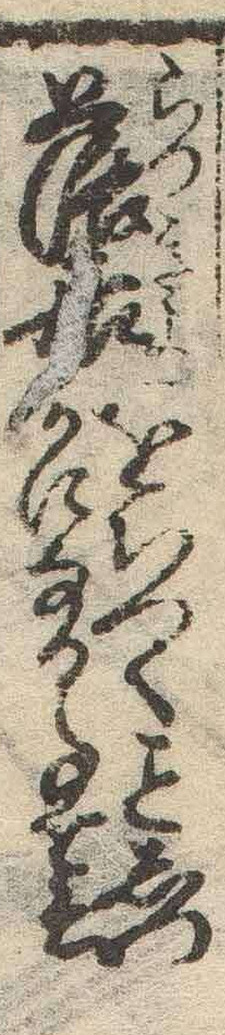落居をちつくことしつ
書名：御成敗式目絵抄
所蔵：東京学芸大学附属図書館 国文学研究資料館
